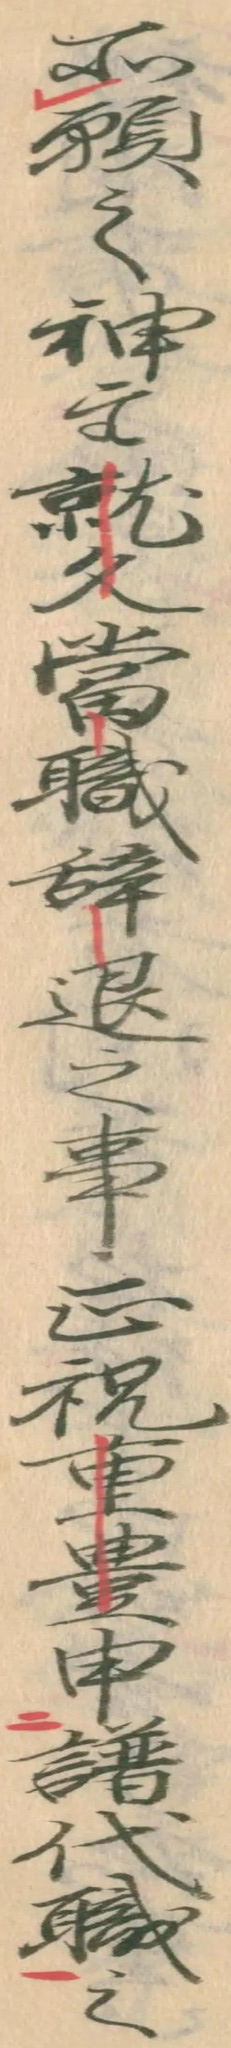所願之神主就久当-職辞-退之事正祝重豊申譜代職之
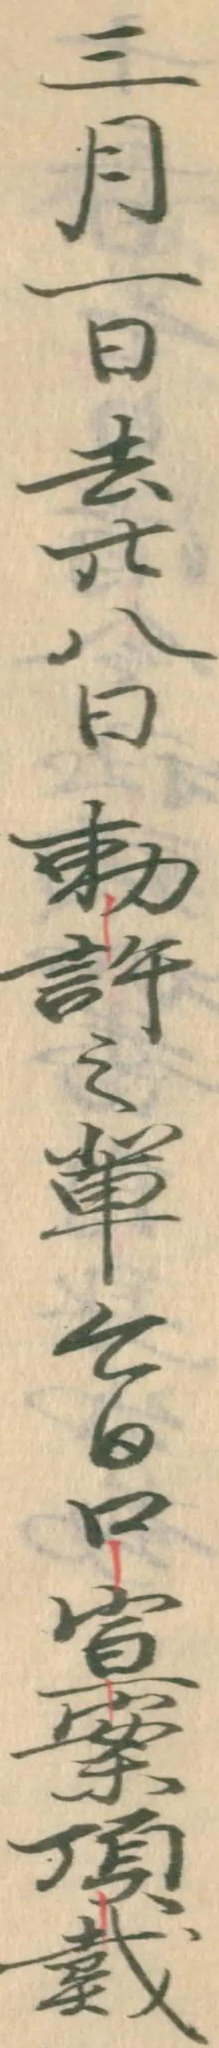三月一日去廿八日勅-許之輩今日口-宣-案頂-戴
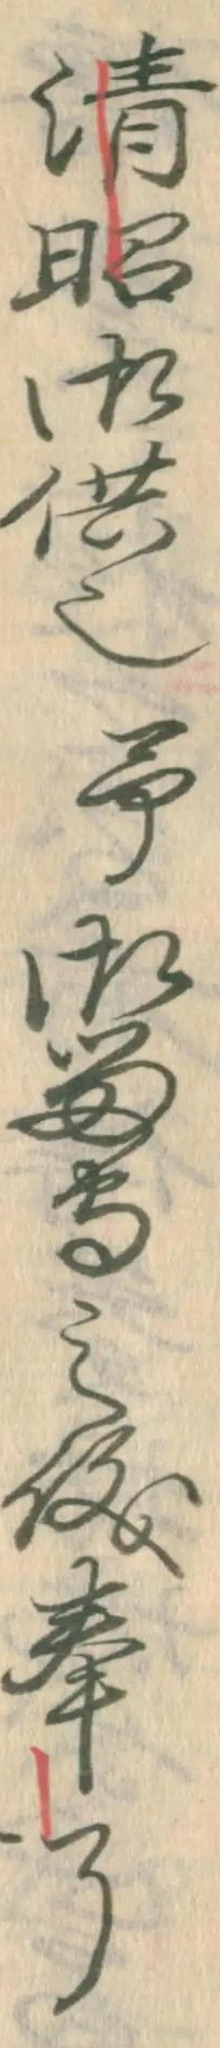清昭御供也予御留守之儀奉_了
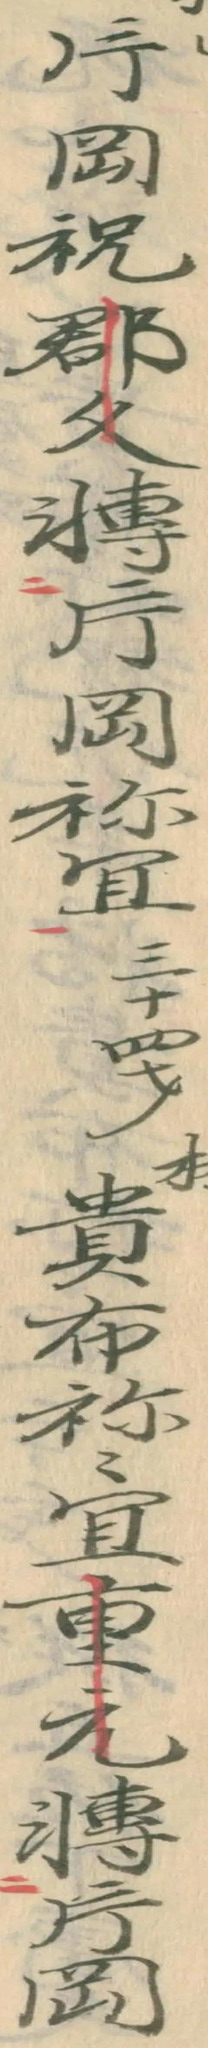片岡祝郡久転片岡祢宜三十四才貴布祢々宜重元転片岡

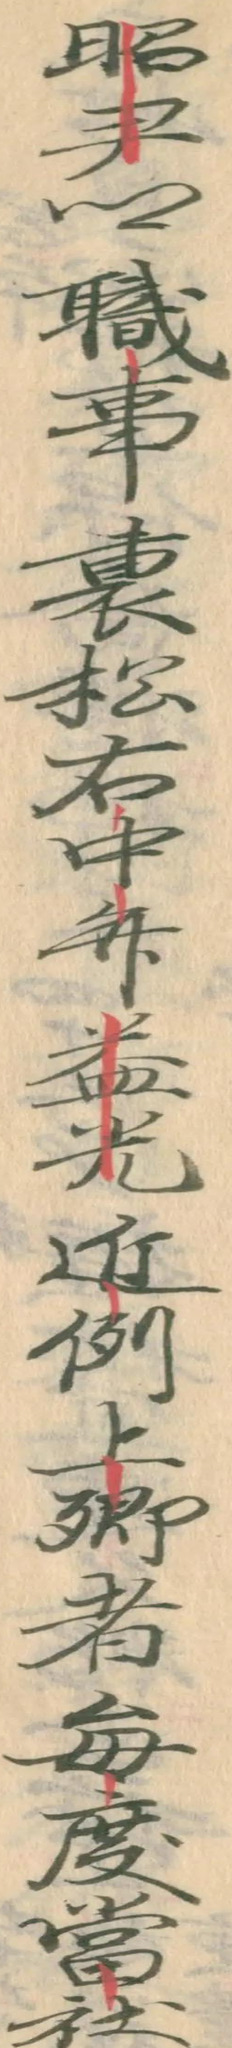昭尹卿職-事裏松右-中-弁益光近-例上-卿者毎-度当-社
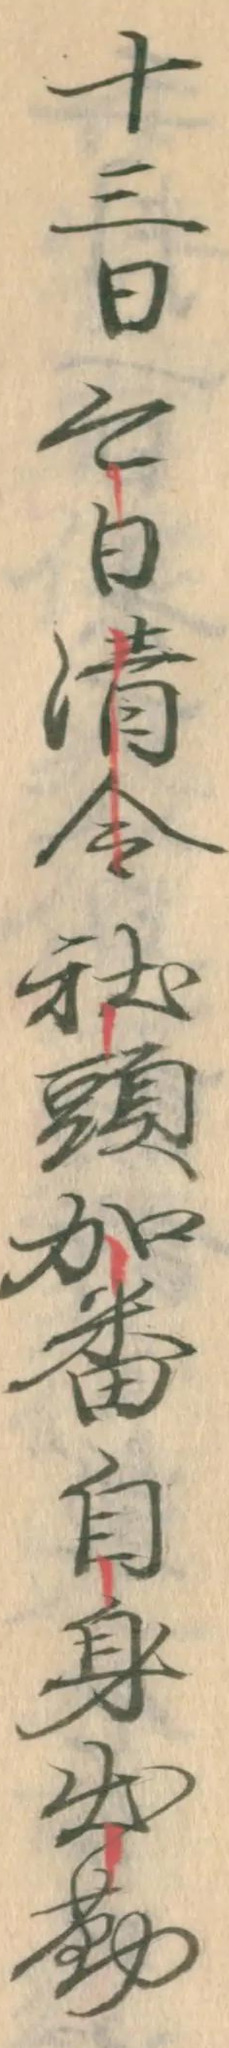十三日今-日清令社-頭加-番自-身出-勤
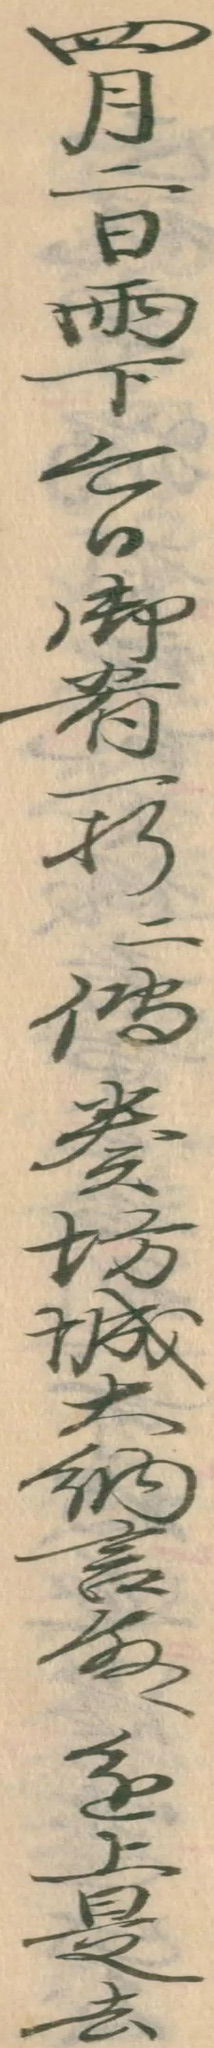四月二日雨下今日御肴一折ニ伝奏坊城大納言殿へ進上是去
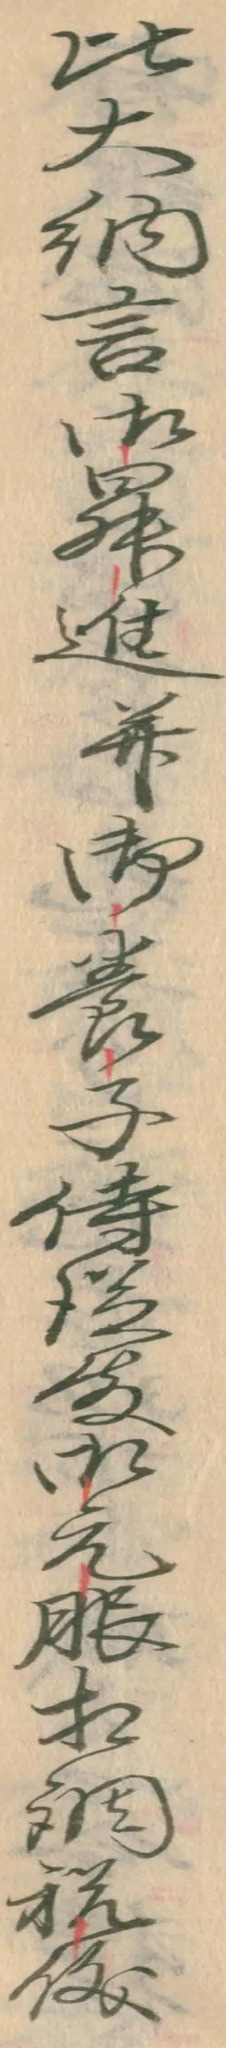比大納言御-昇-進并御-養-子侍従殿御-元-服相調祝-儀
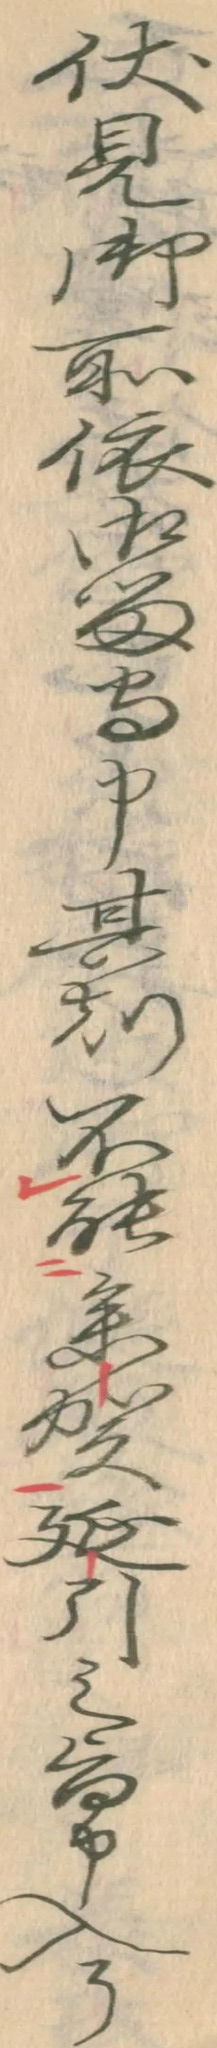伏見御所依御留守申其刻不能参-賀延-引之旨申入了
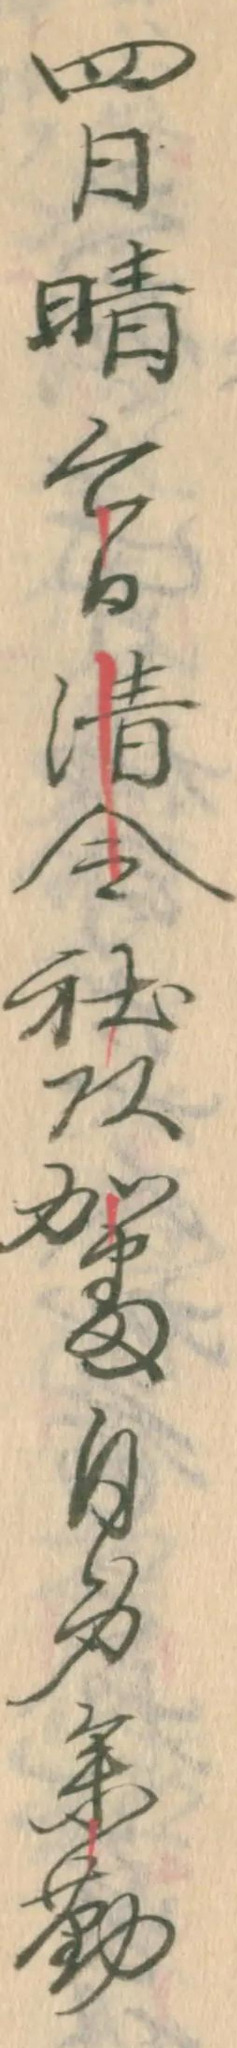四月晴今-日清令社-頭加-番自身参-勤
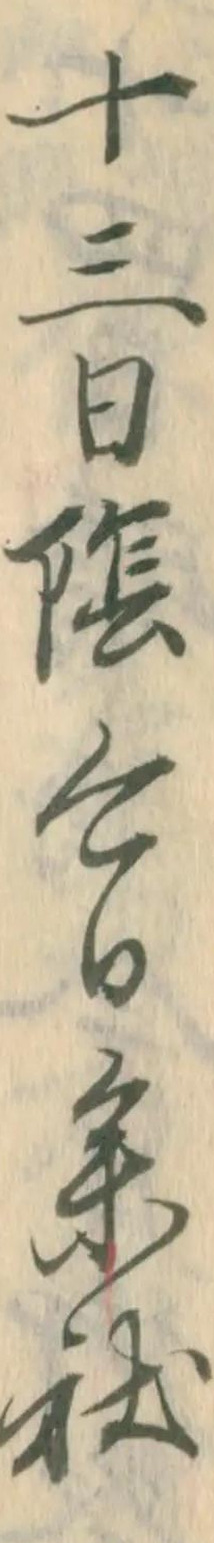十三日陰今日参社

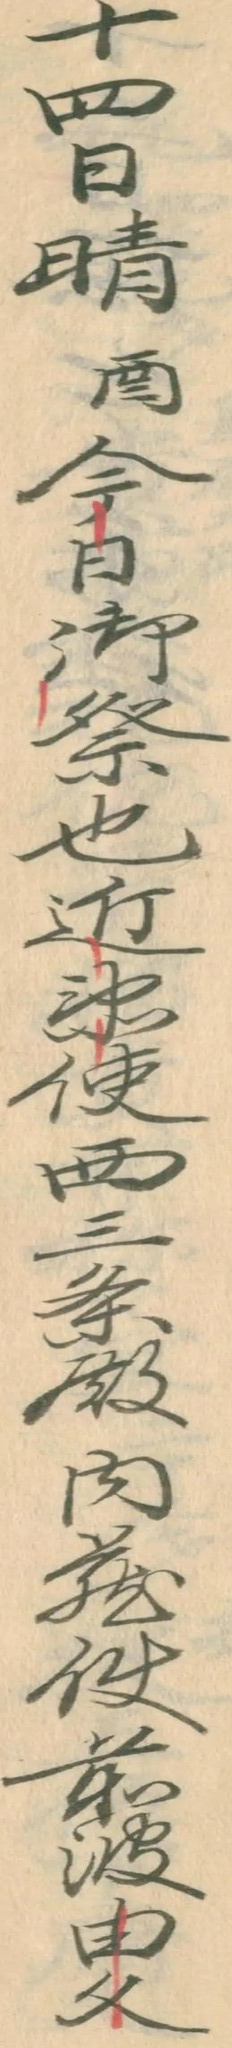十四日晴酉今-日御_祭也近-衛-使西三条殿内蔵使前波由久
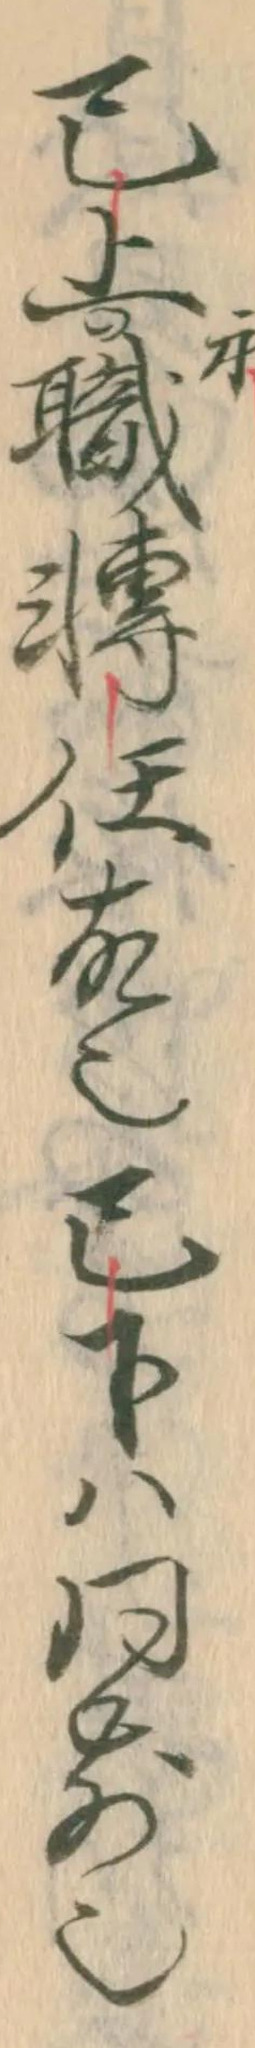已-上￮職転-任故也已-下ハ同前也
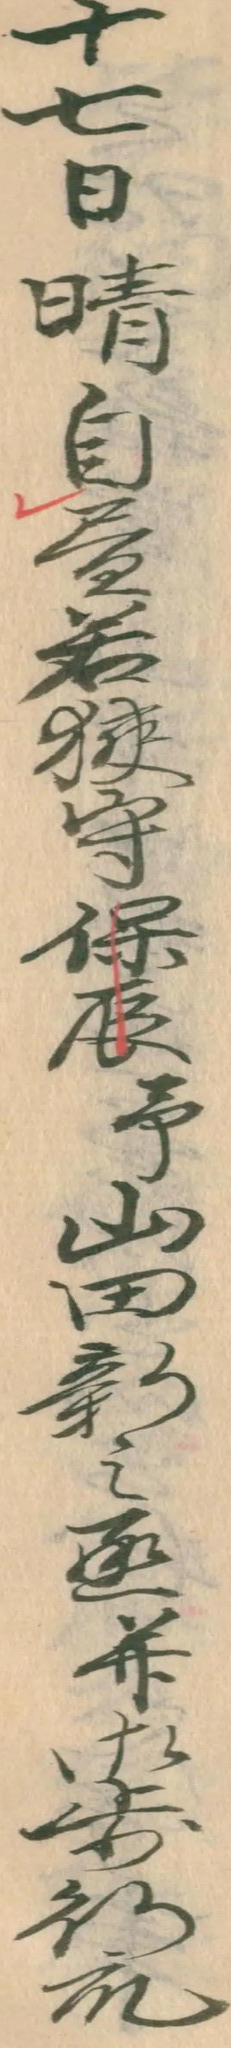十七日晴自昼若狭守保辰予山田新之丞并御歩行衆
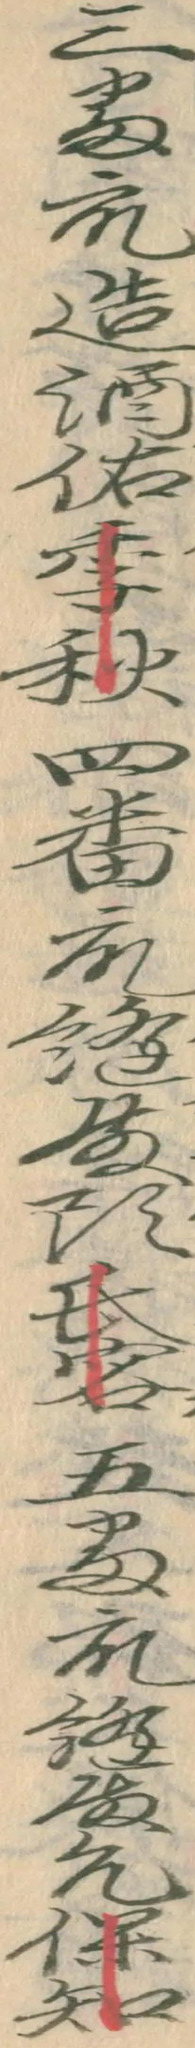三番衆造酒佑季秋四番衆縫殿頭氏客五番衆縫殿允保知

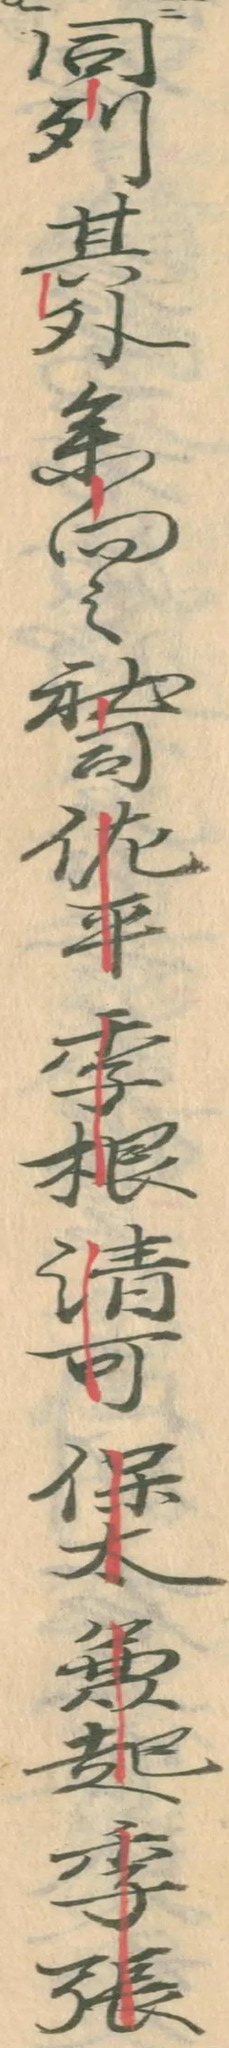同-列其_外参-向之社-司佐平季根清可保太兼起季張
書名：賀茂社記録. 第15冊
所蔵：国立国会図書館 National Diet Library, JAPAN
